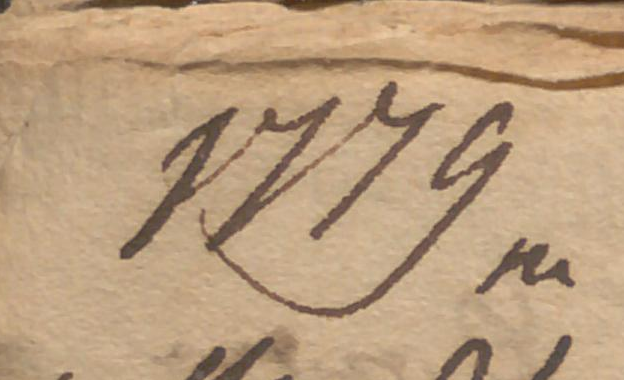1779
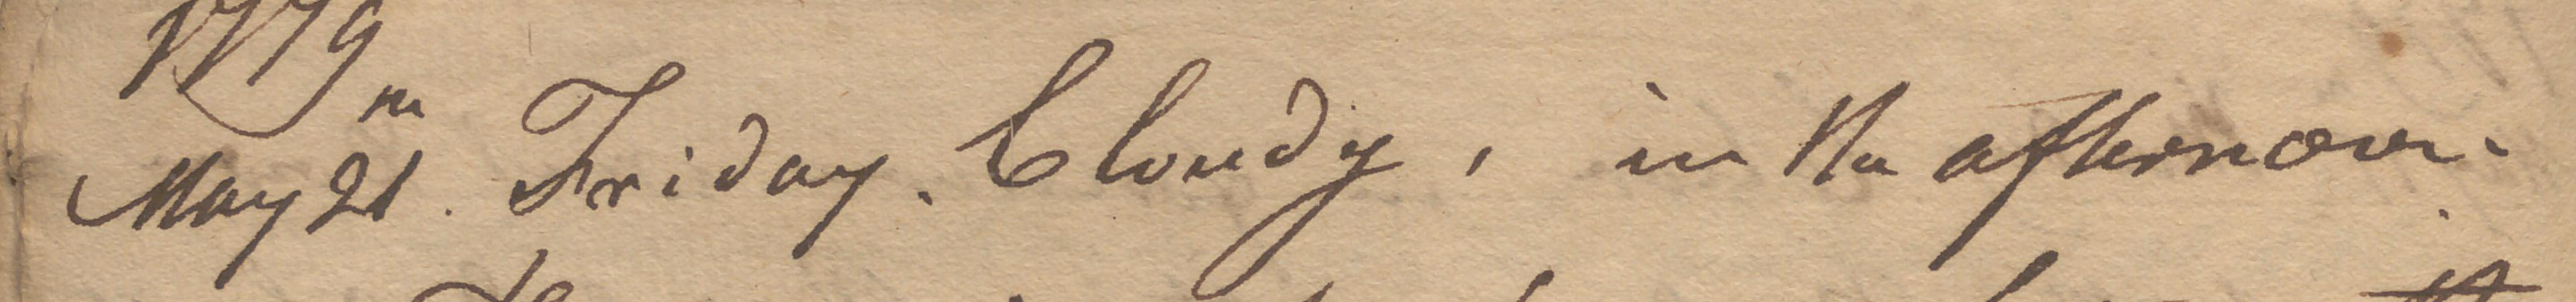May 21^th. Friday. Cloudy, in the afternoon
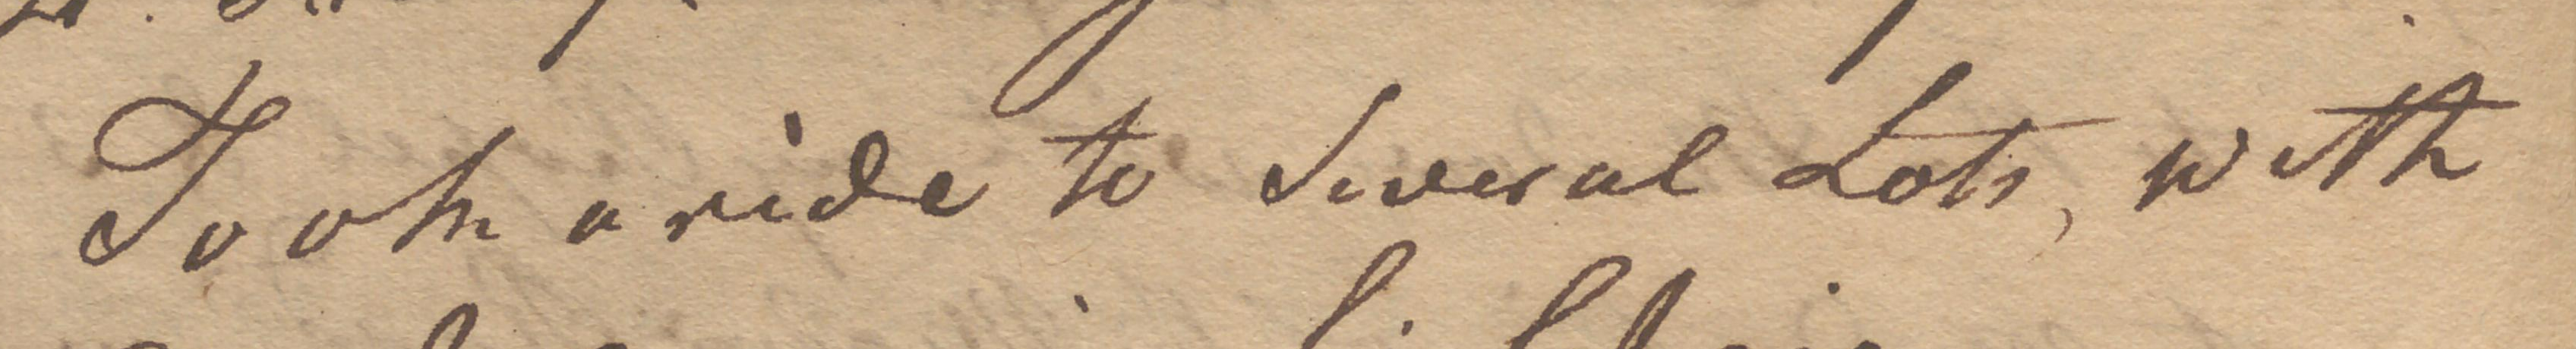Took a ride to Several Lots, with
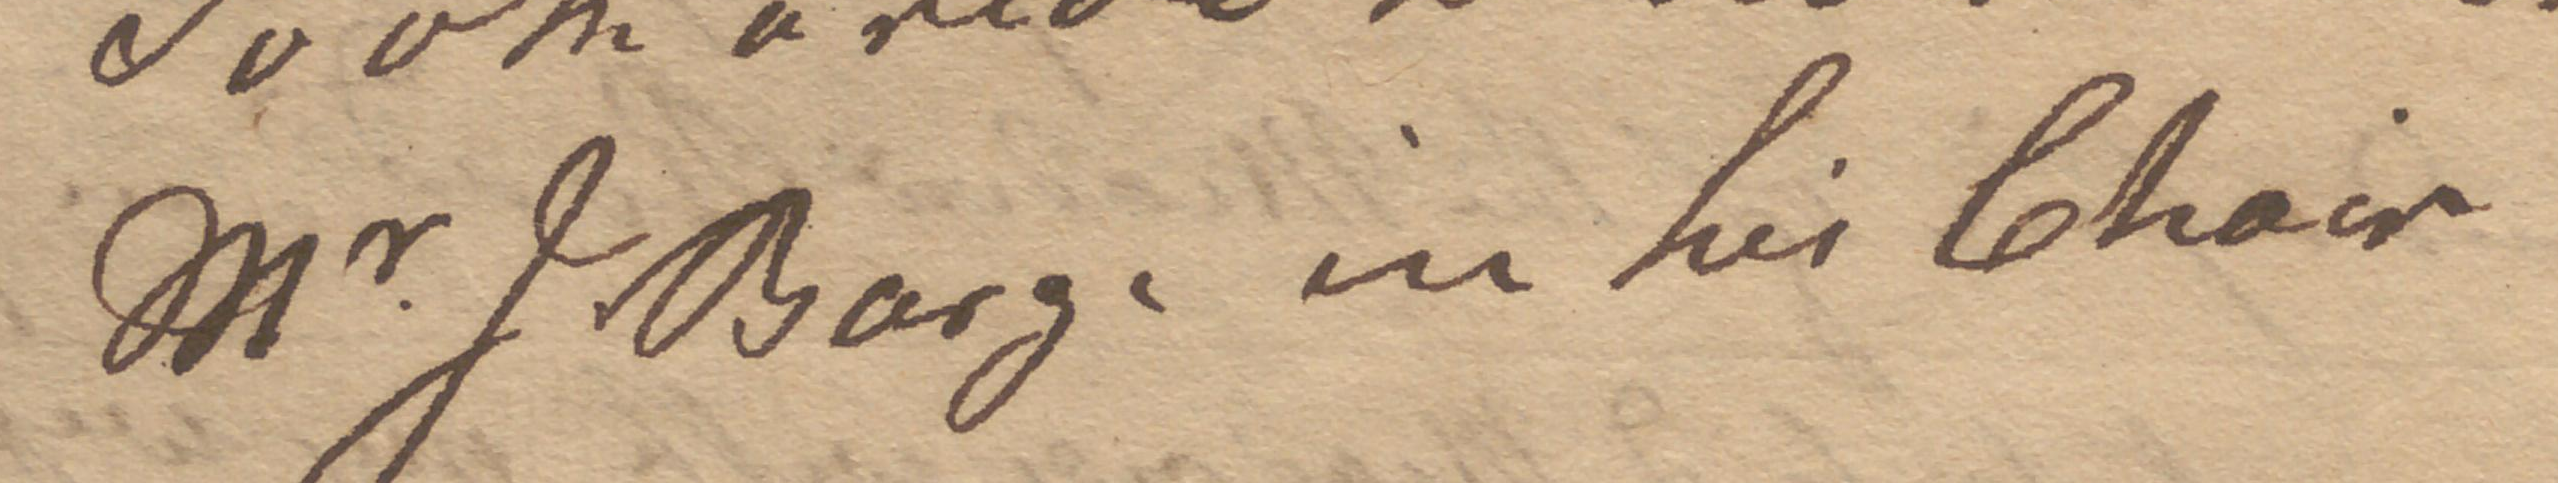M^r. J Barge in his Chair
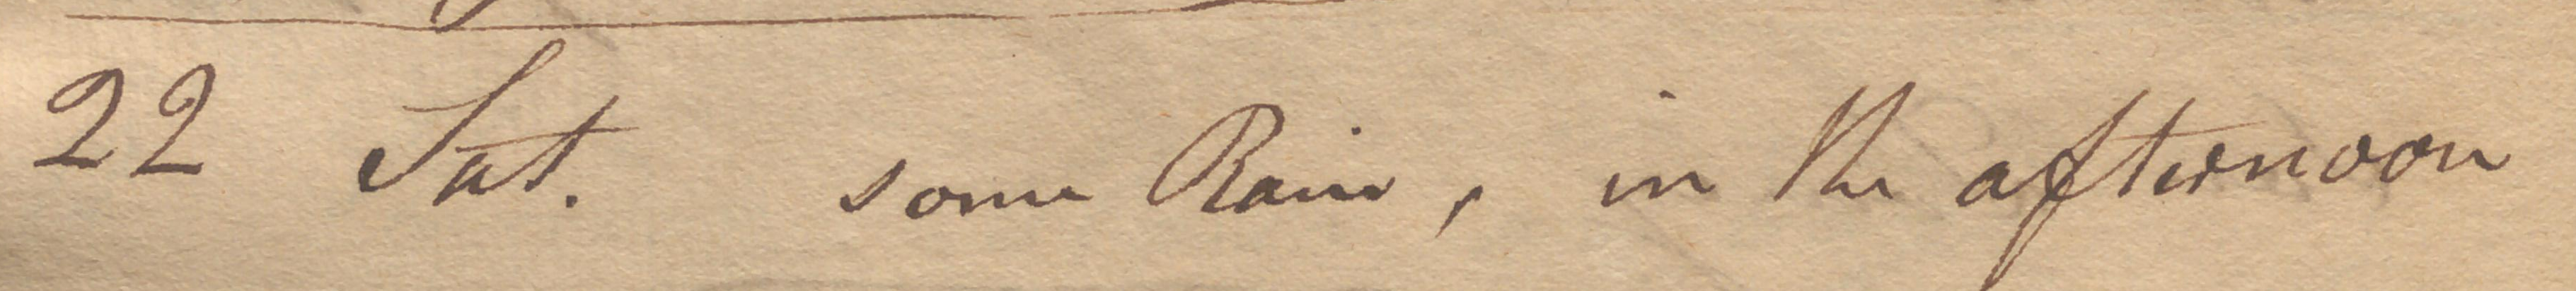22 Sat. some Rain, in the afternoon
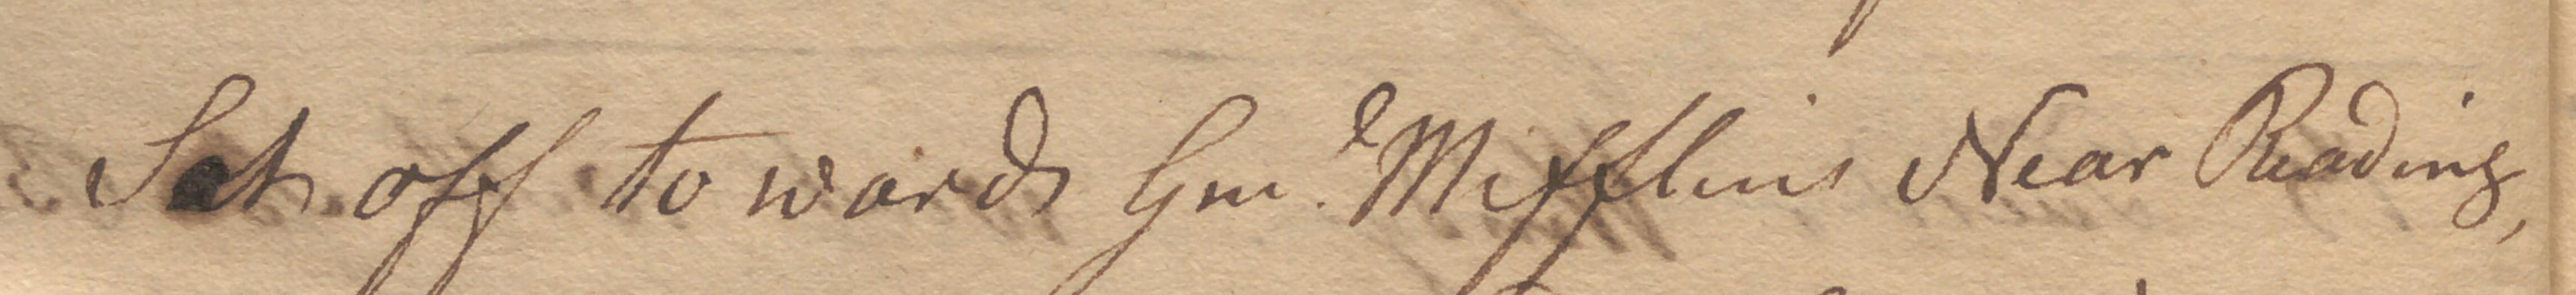Sat off to wards Gen^l. Mifflins Near Reading
